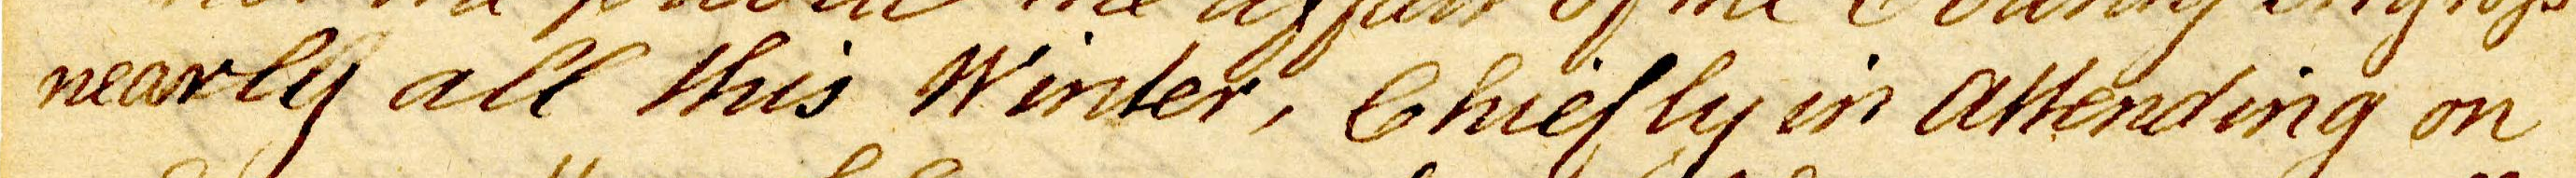nearly all this Winter, Chiefly in Attending on
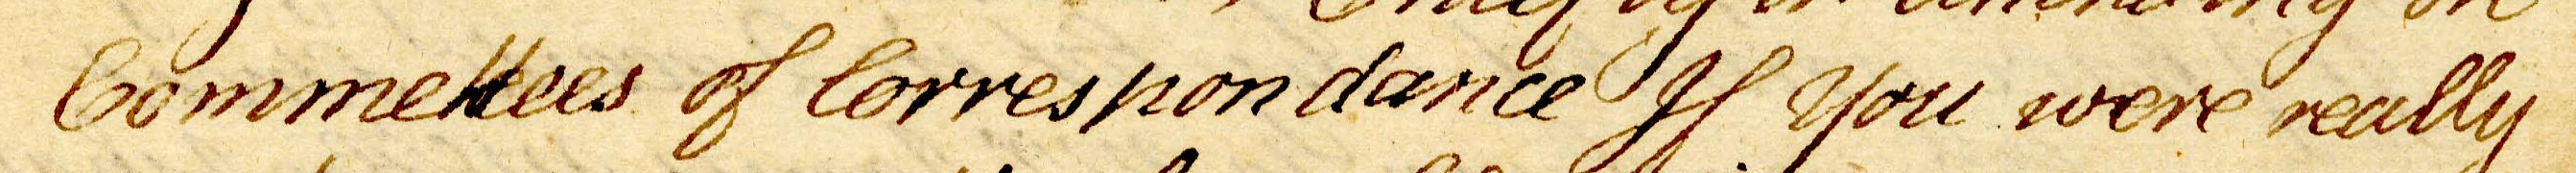Commettees of Correspondance If You were really
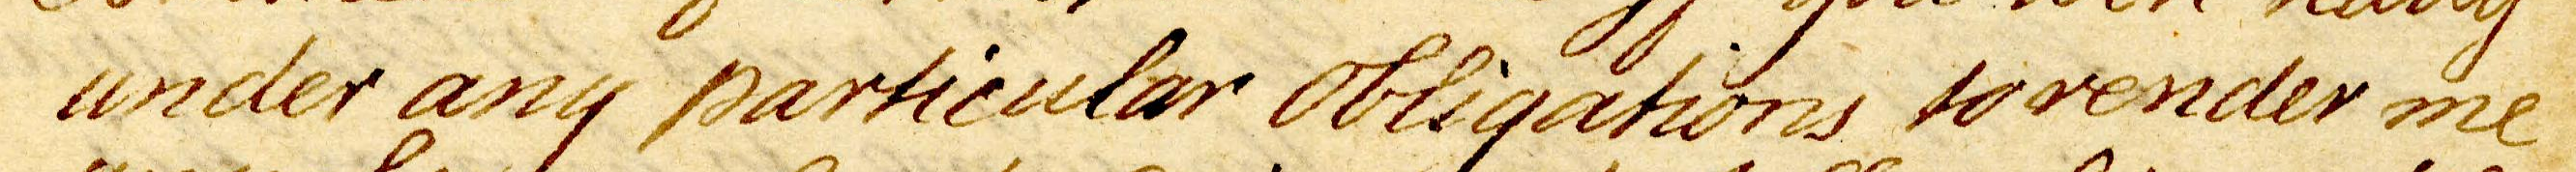under any particular Obligations to render me
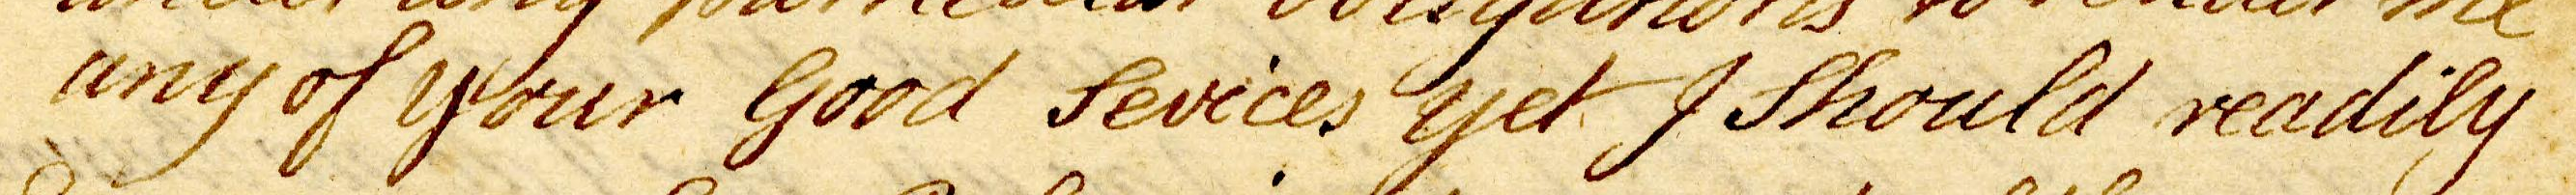any of Your Good Sevices Yet I Should readily
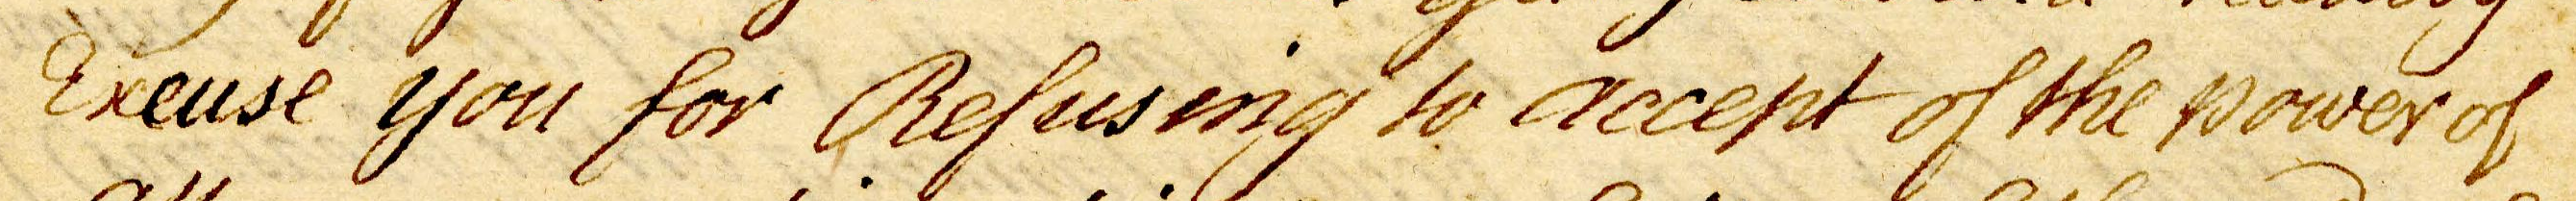Excuse you for Refusing to Accept of the power of
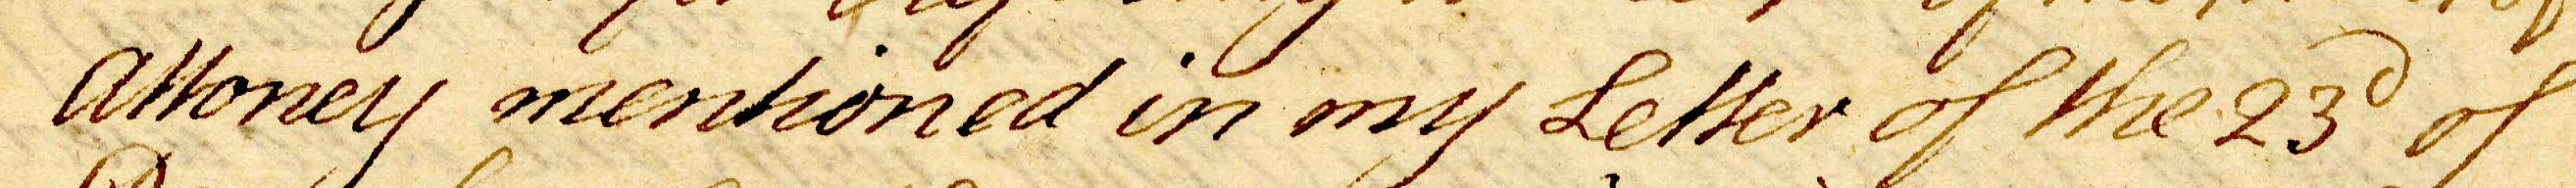Attoney mentioned in my Letter of the 23^d of
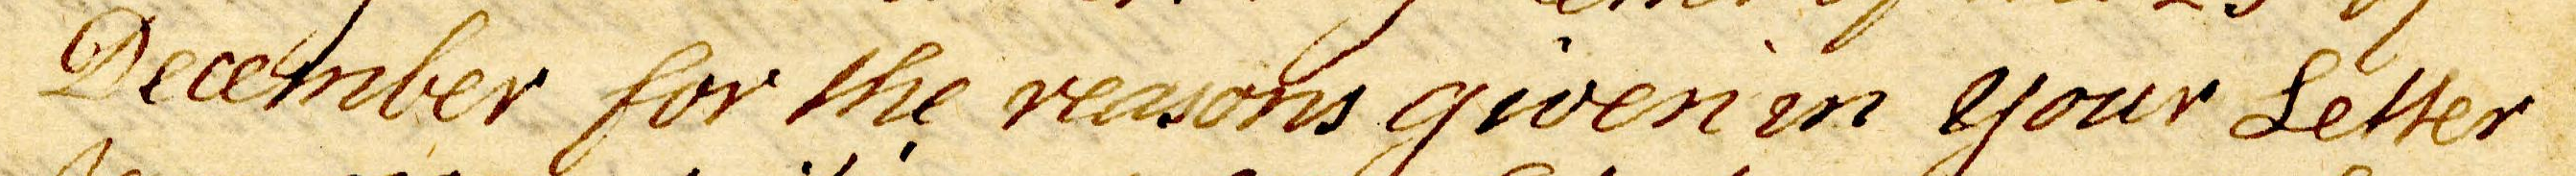December for the reasons given in Your Letter
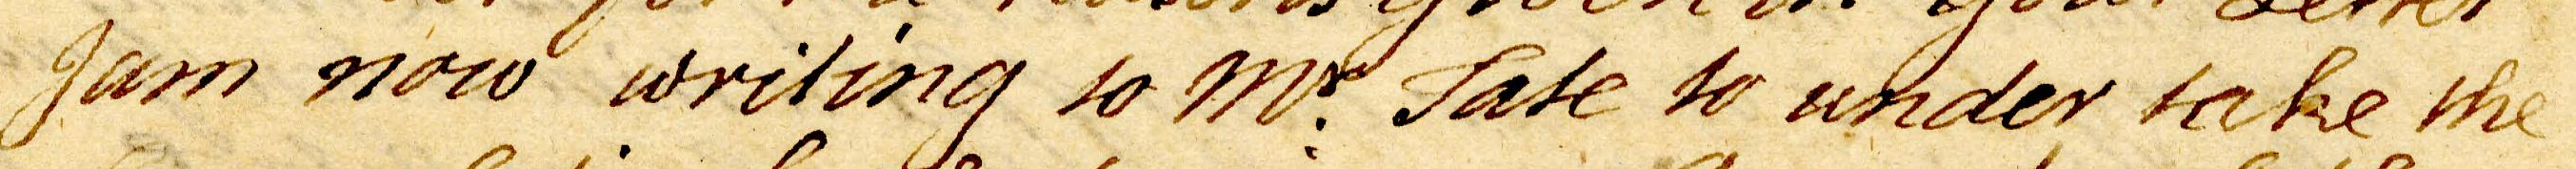I am now writing to M^r. Tate to under take the
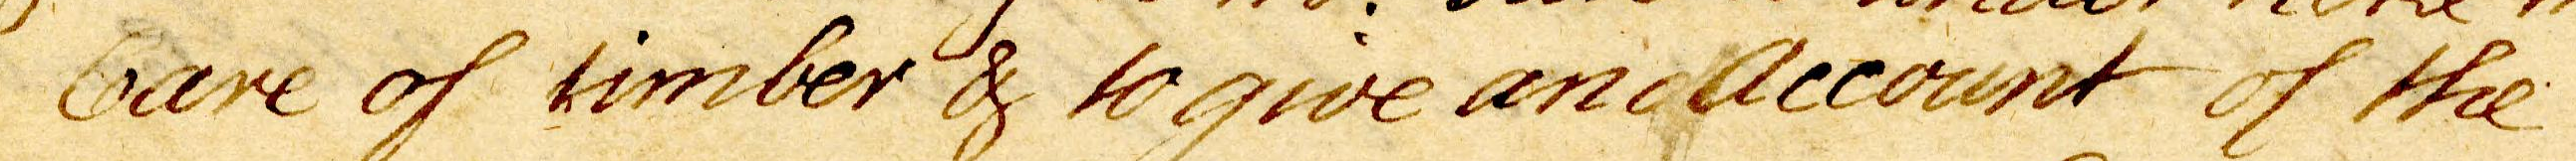Care of timber & to give an Account of the
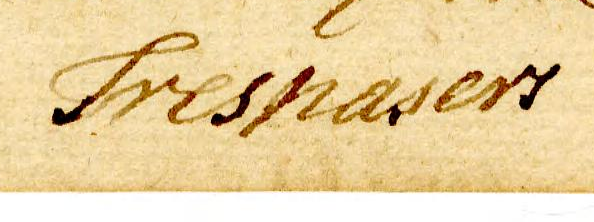Trespasers
